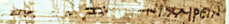δηϲ ζ νιχαιρειν
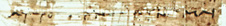αυτο ν ν μαι
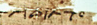αιδιατο
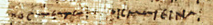ροϲτετωι ριϲμωιειναι
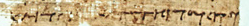καιτ ν γωγηιτουϲιτου
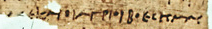εκαιοιαγριοιβοεϲημαϲ
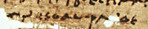νθεοδωρα δε
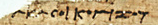λκαϲοικομιζου
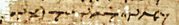ονχιτωνατονλευ
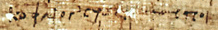κοφαιονϲυ ωϲποι
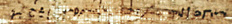ηϲει γραψ φιλ νιοπωϲ
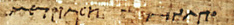μετριαϲηι μιναπο
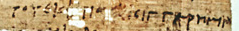τουεκφ ριο ειϲιγγαρημιν
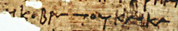ηκοβρωτουκαικα
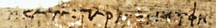ηκα παρμενηυφη
